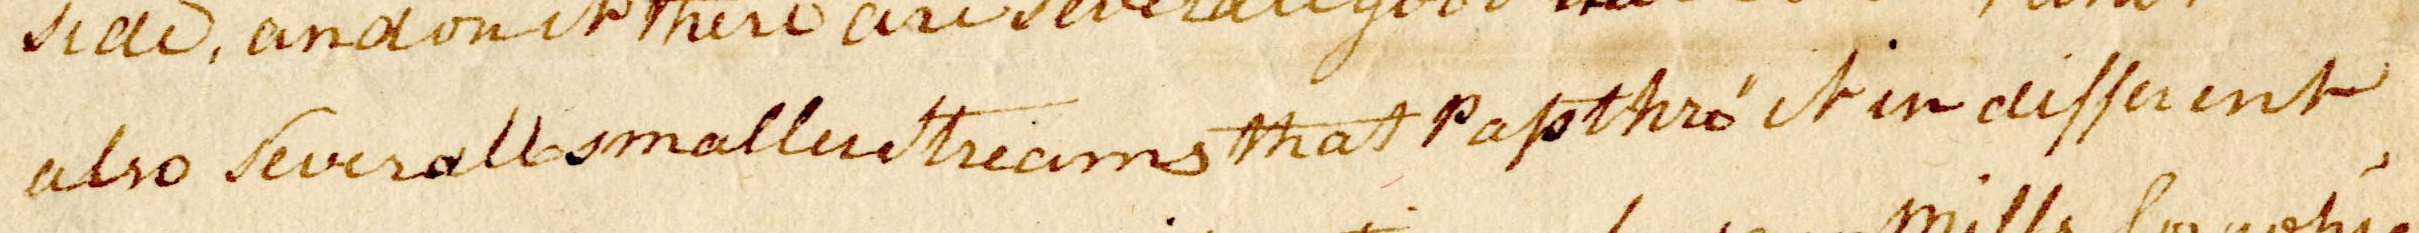also severall smaller Streams that Pass thro' it in different
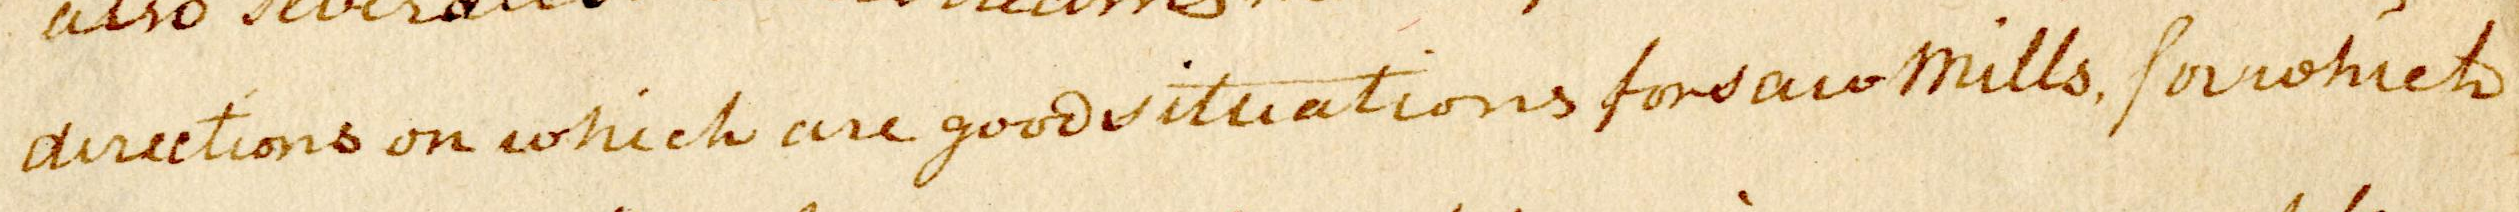directions on which are good situations for saw mills, for which
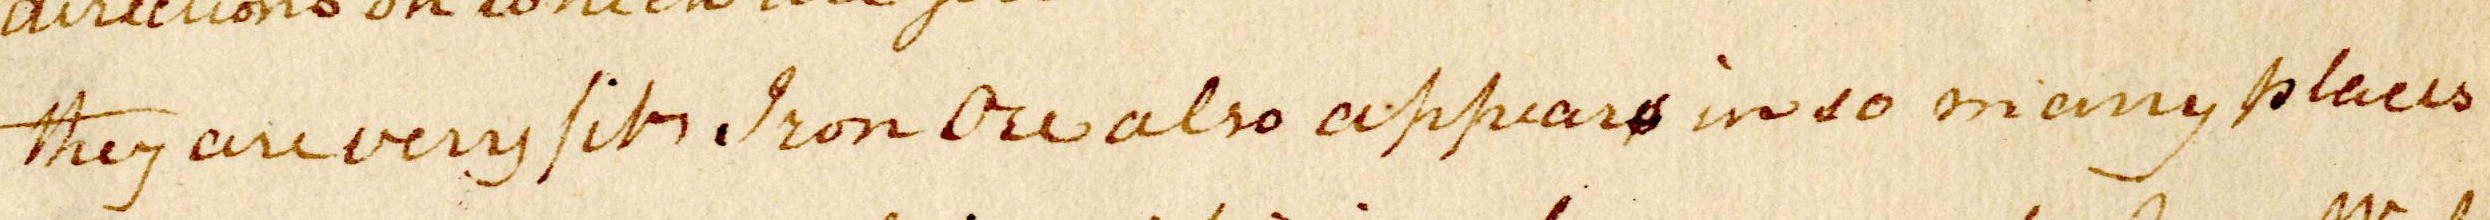they are very fit Iron ore also appears in so many places
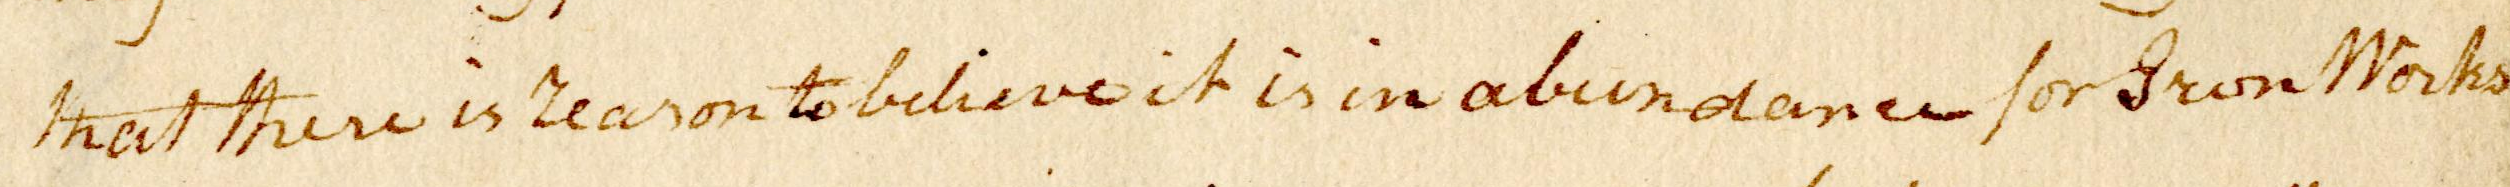that there is reason to believe it is in abundance for Iron Works
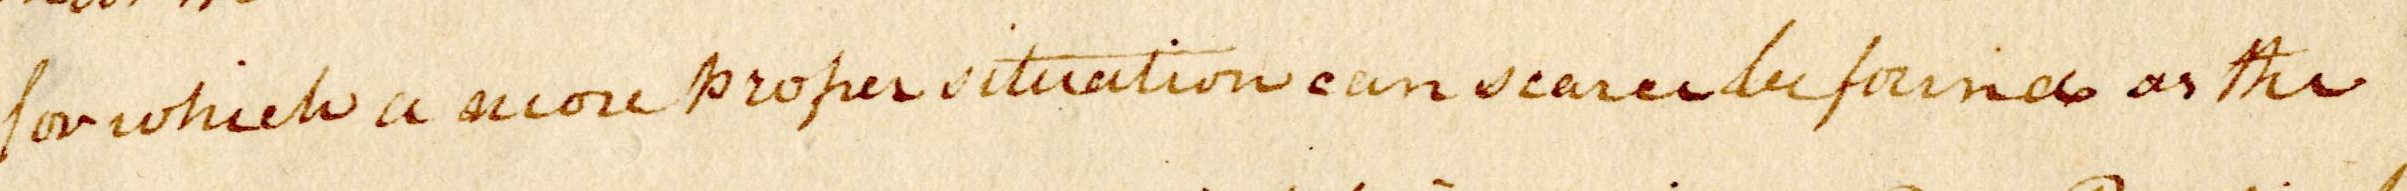for which a more proper situation can scarce be found as the
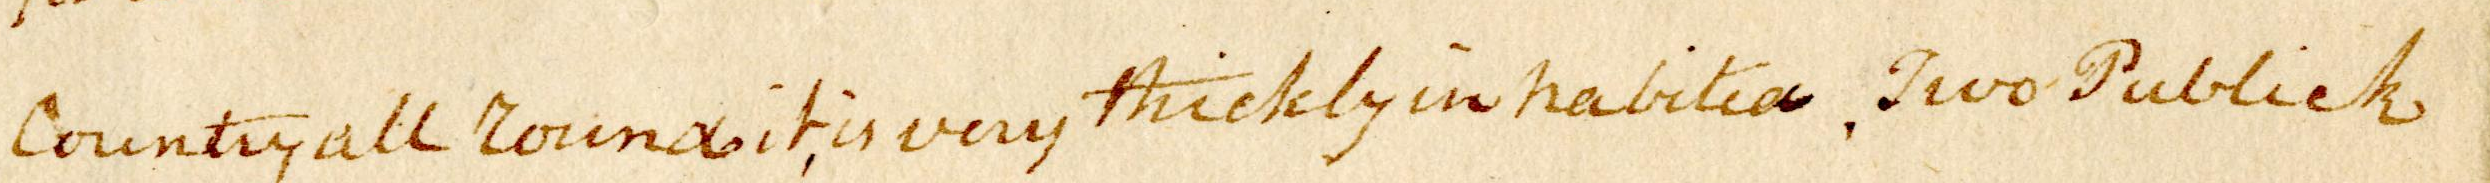Country all round it is very thickly inhabited. Two Publick
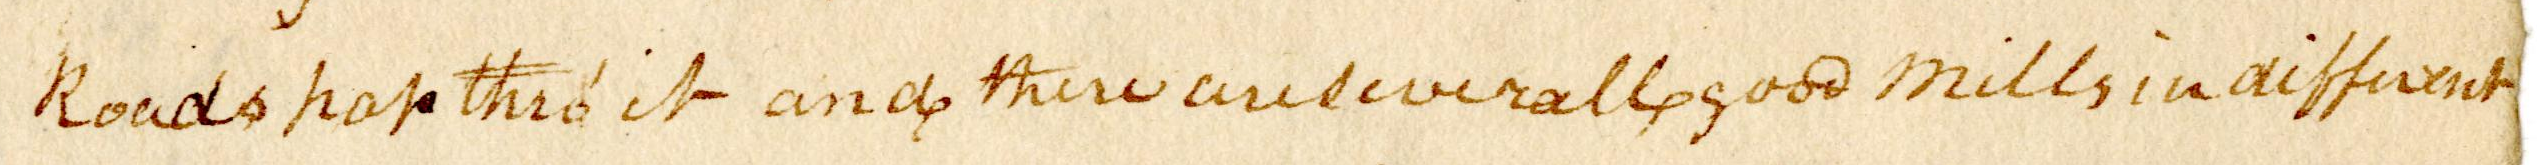Roads pass thro' it and there are severall good Mills in different
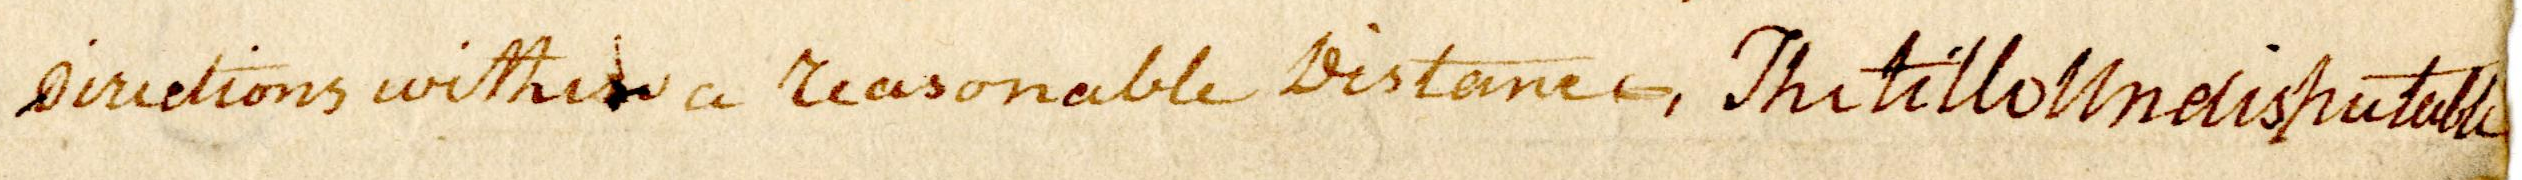direction within a reasonable Distance, the tills undisputable
